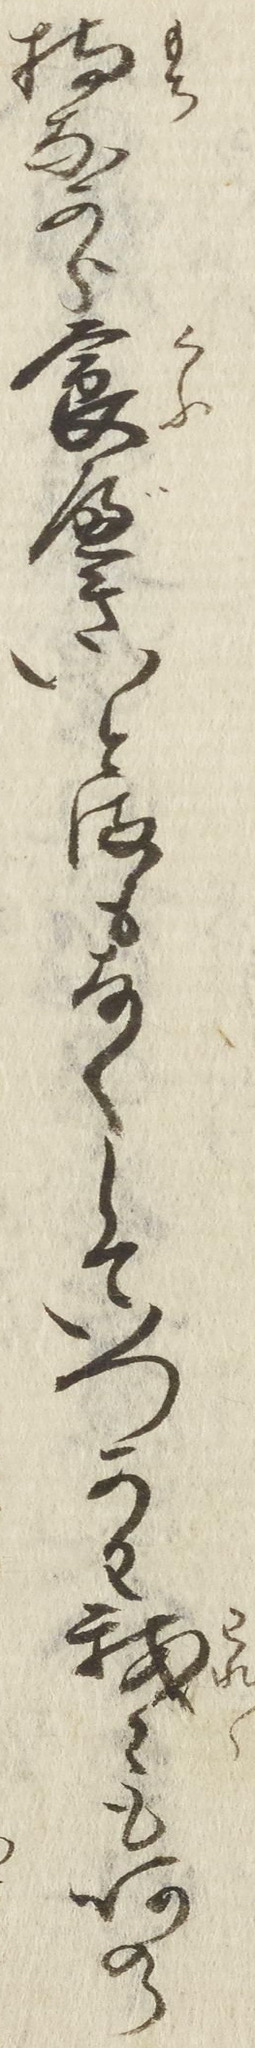持なから食べきいとまもなくしていつかわ我〻もあの
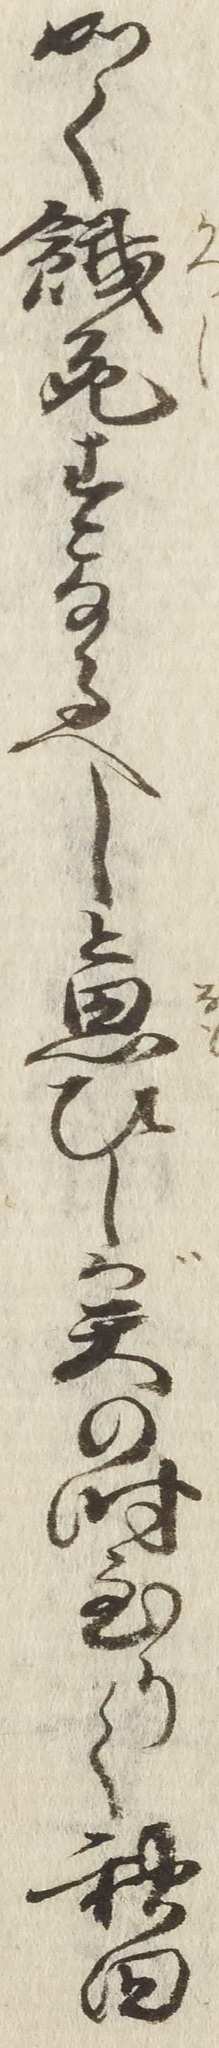如く餓死すなるへしと思ひしが天の時至りて秋田
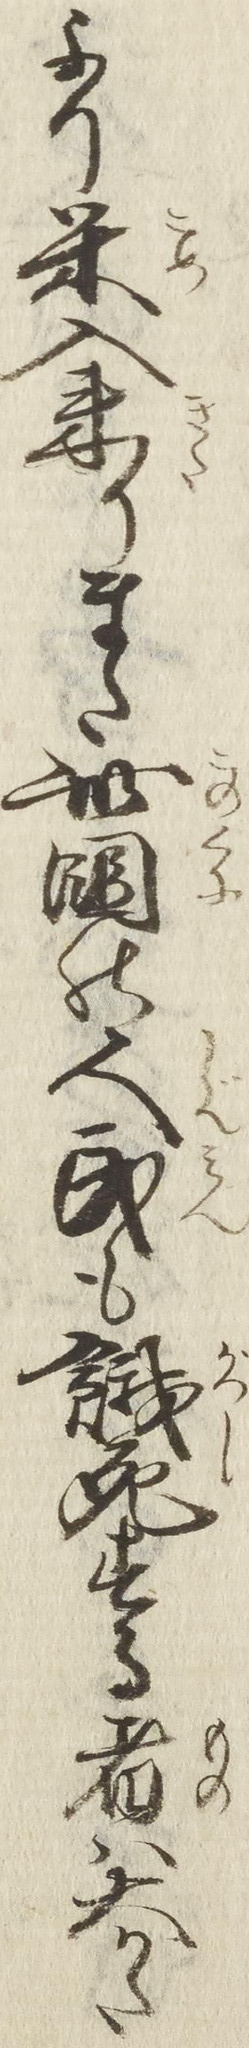より米入来りまた此国の人民も餓死する者は大かた
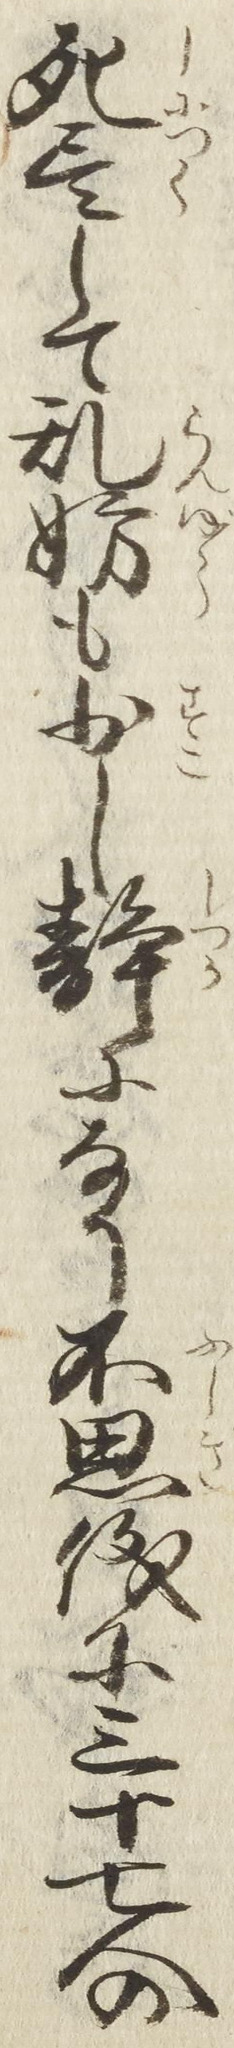死尽して乱妨も少し静になり不思儀に三十七人の
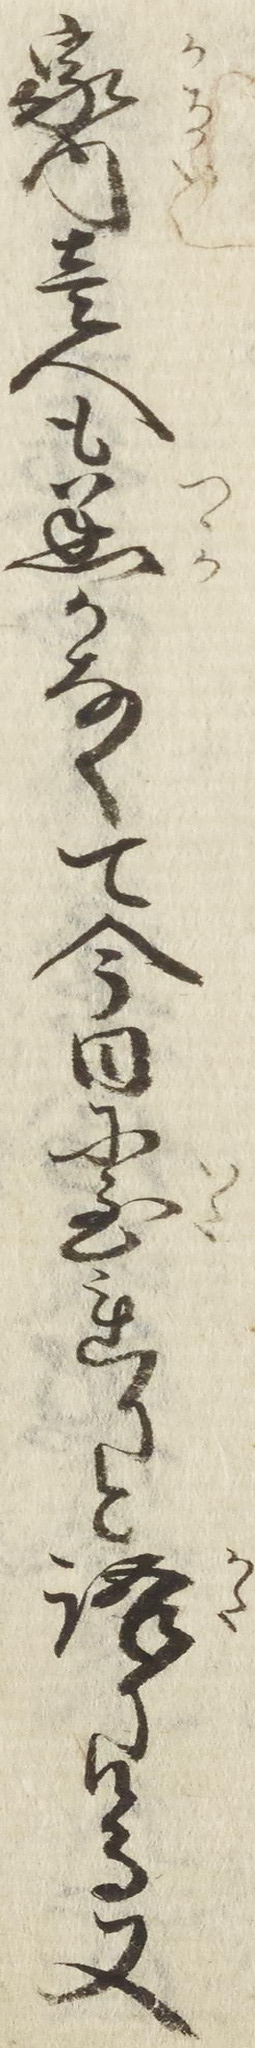家内壱人も恙かなくて今日に至れりと語りける又
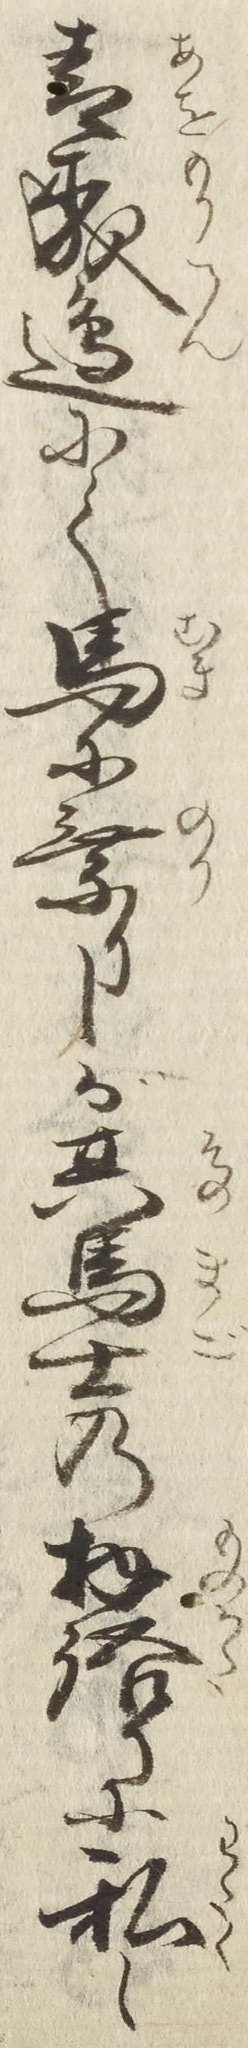青森辺にて馬に乗りしが其馬子の物語りに私し
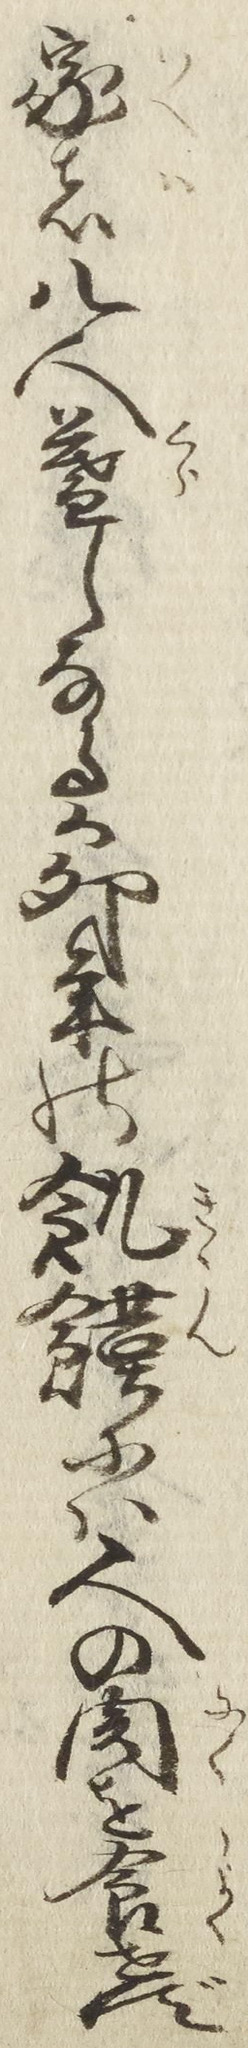家者八人暮しなるか卯年の飢饉には人の肉を食せず

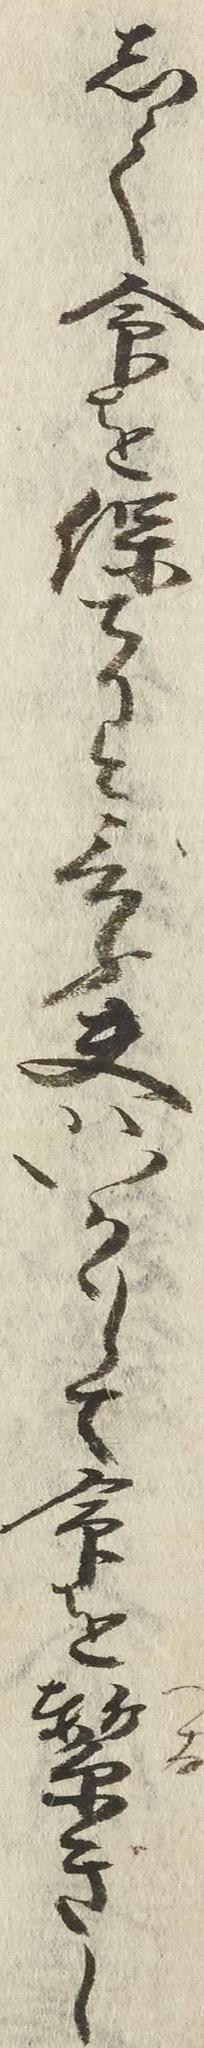して命を保てりと言ふ夫はいかゝして命を繋ぎし
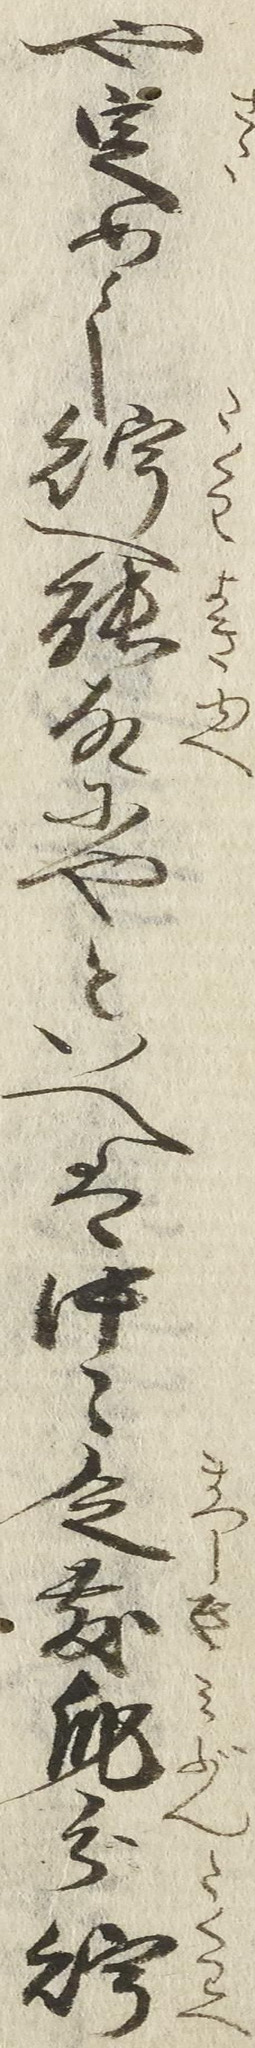や定めて貯へ能故にやといへは中〻乏敷身分貯
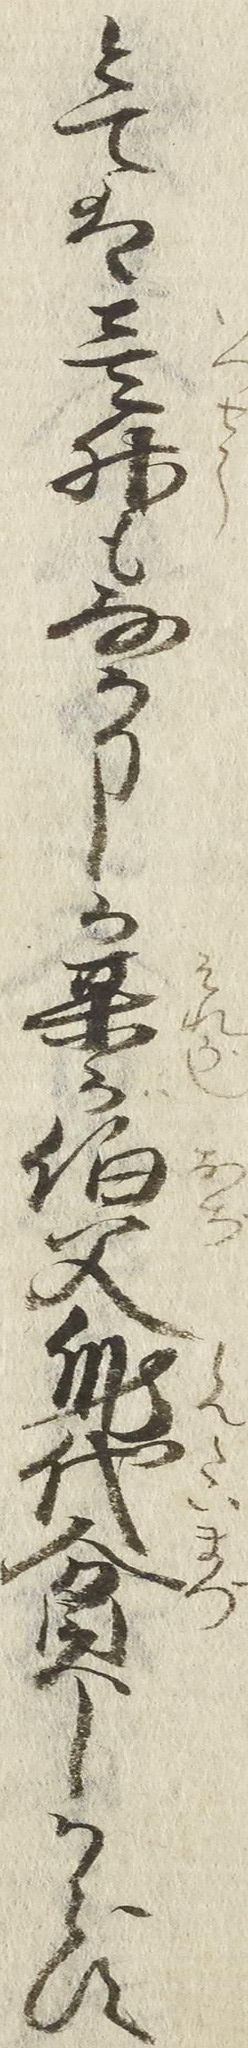とては一升もなかりしか某か伯父身代貧しからす
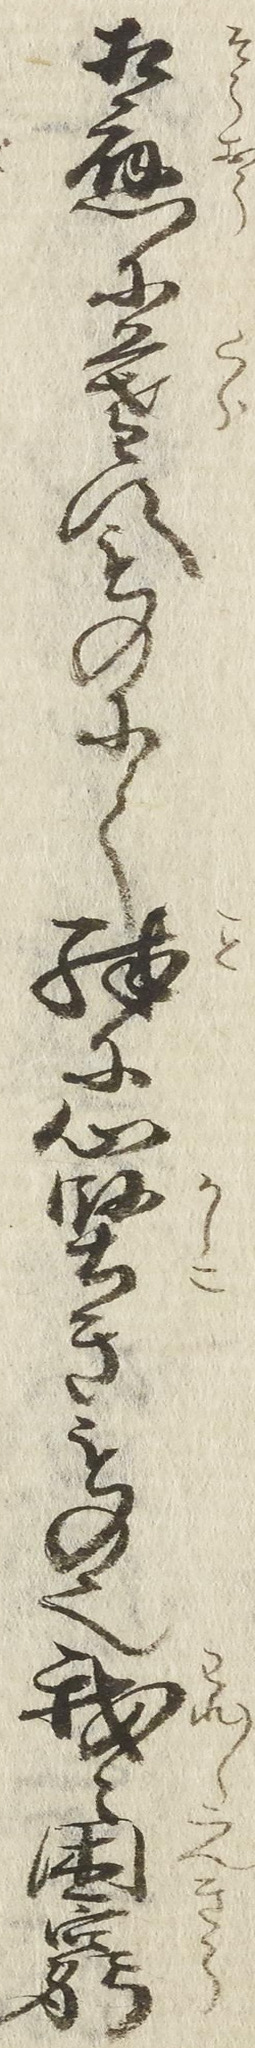相応に暮すものにて殊に心堅きもの也我〻困窮
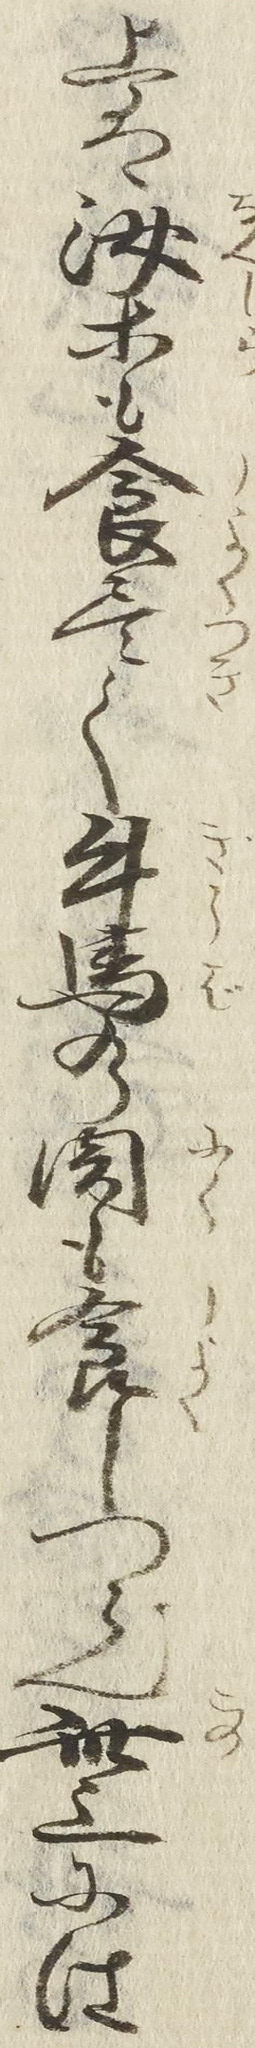上は汝等も食尽て牛馬の肉も食しつらん此上には
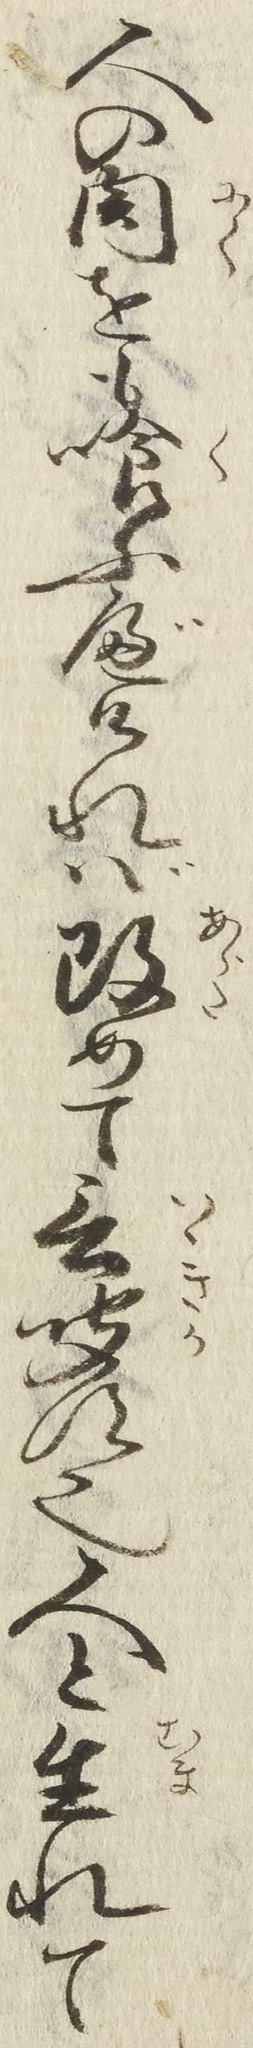人の肉をも喰ふべければ改めて言聞す也人と生れて
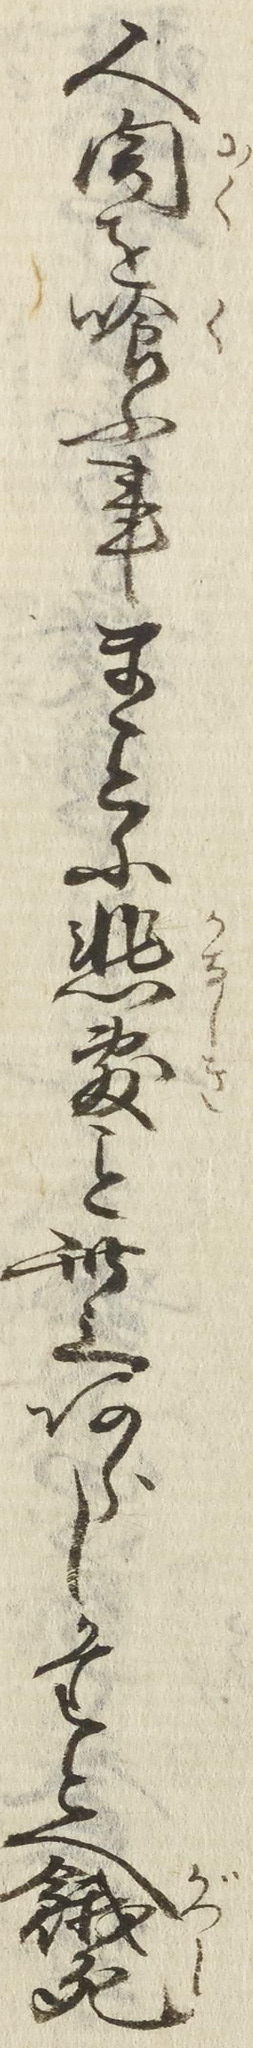人肉を喰ふ事まことに悲敷こと此上あらしたとへ餓死
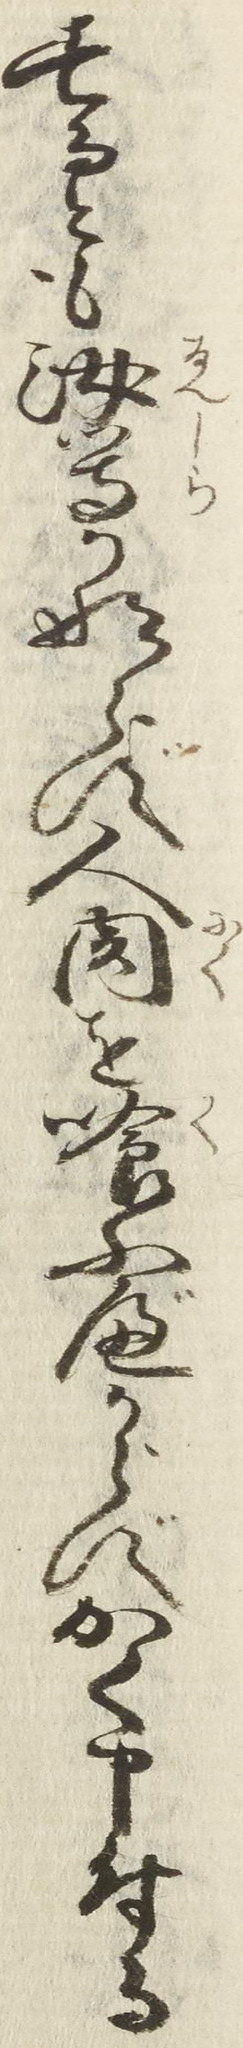するとも汝等かならず人肉を喰ふべからずかく申付る
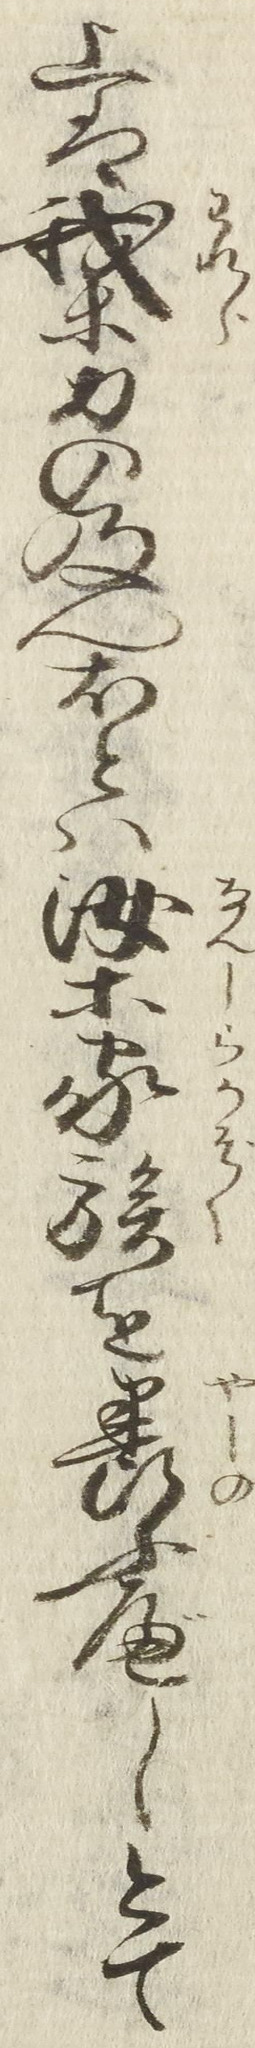上は我等力の及んほとは汝等家族を養ふべしとて
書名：天明奇畧　全
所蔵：東京大学地震研究所図書室 Earthquake Research Institute Library, The University of Tokyo, JAPAN
